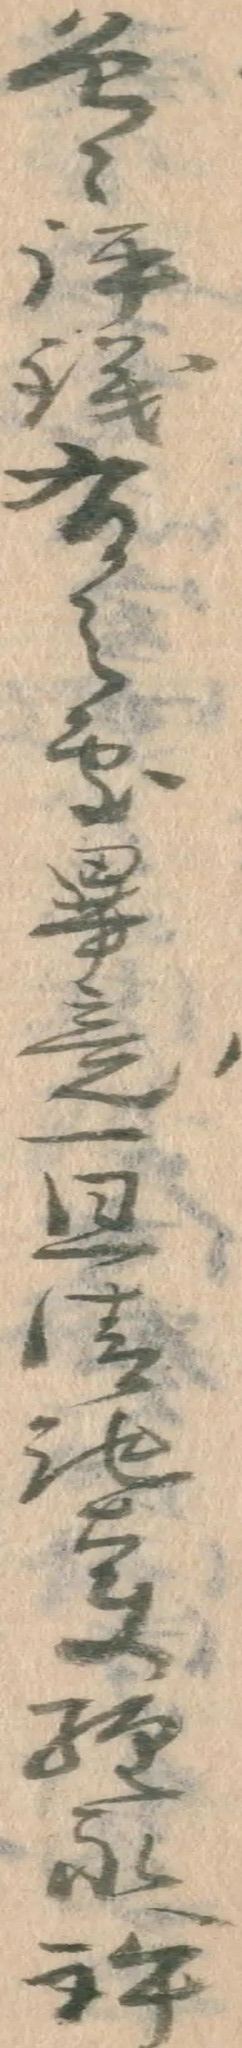色〻評議有之處、畢竟一旦清純大夫経永ヘ許
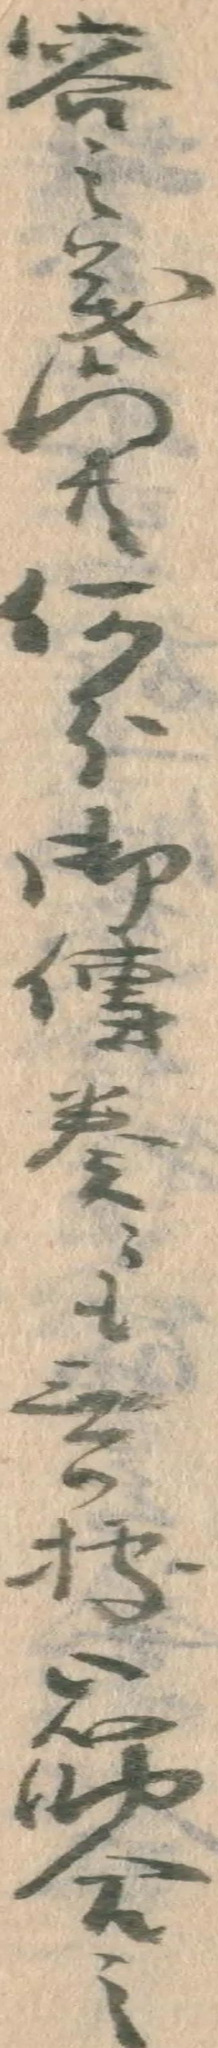容之義候得共、何分御伝奏ニも無御拠ハ筋合之
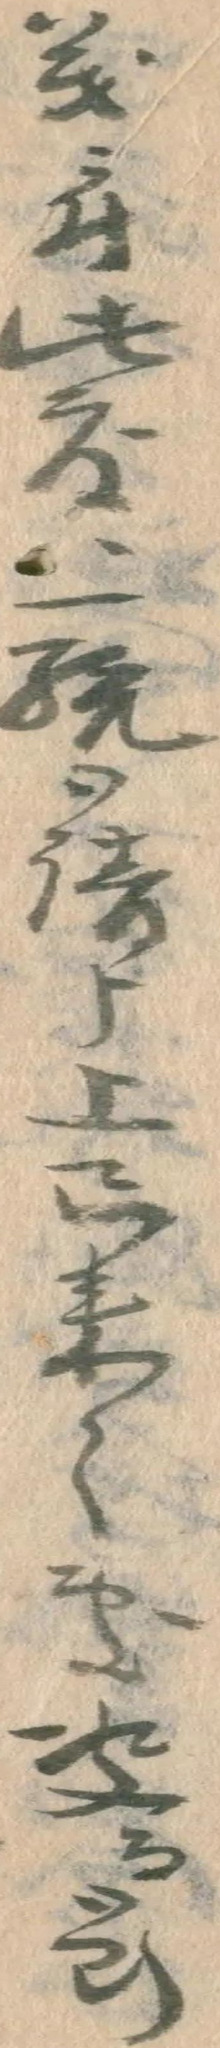義ニ付、此度は一統御請申上、巳来之處決而御断
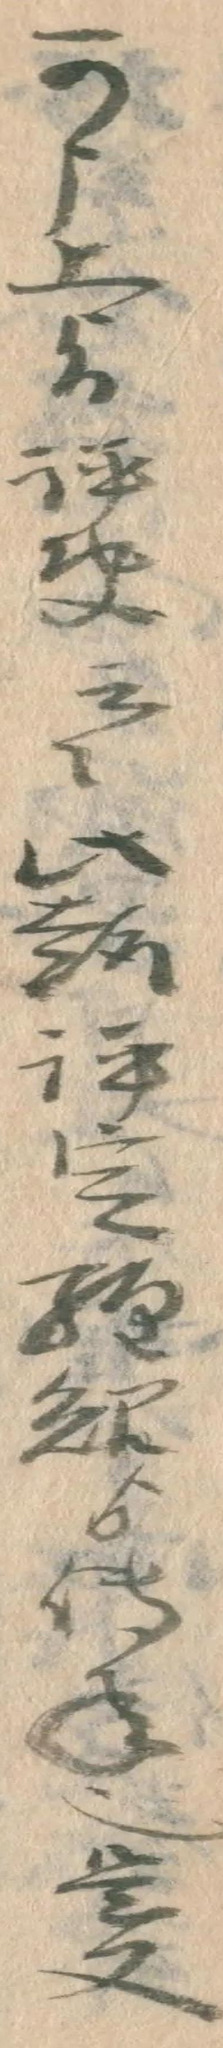可申上旨評決云々、此趣、評定経規ゟ伝承也、是又
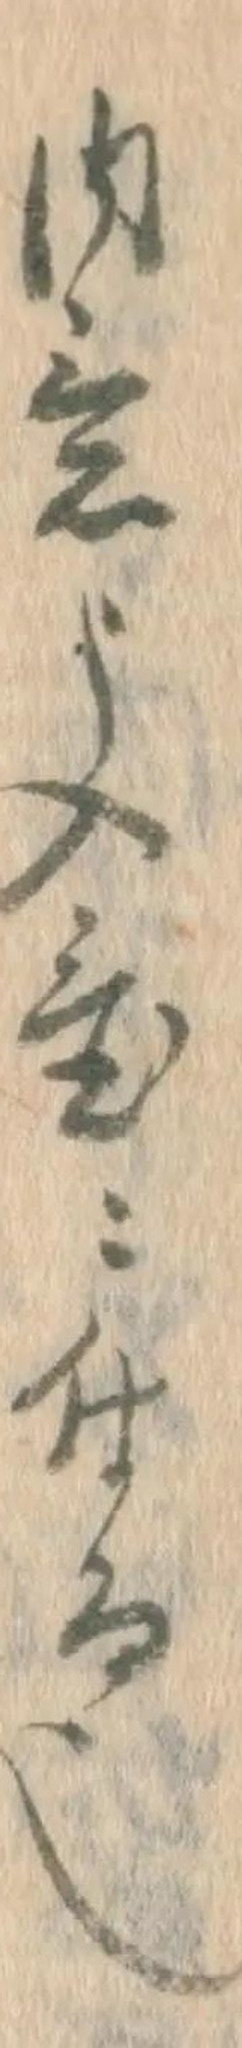内意申入置ニ付而也、
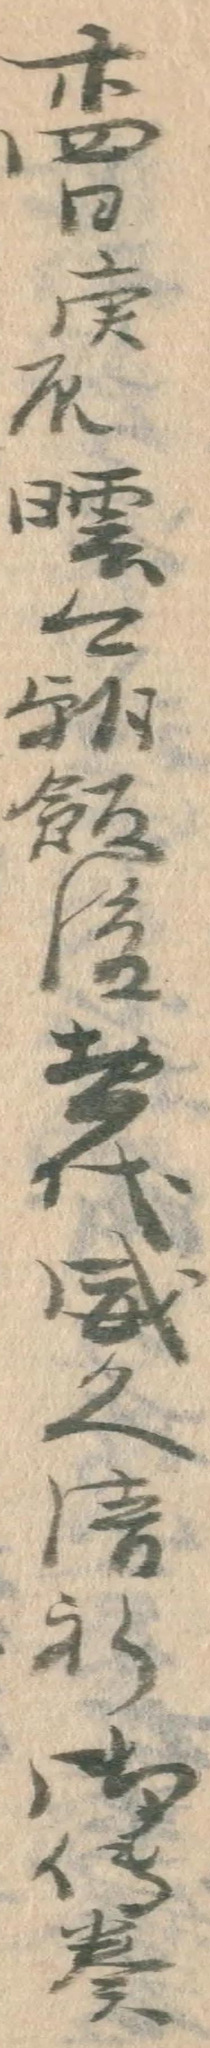廿四日庚辰雲、今朝飯後惣代威久・清祈、御伝奏
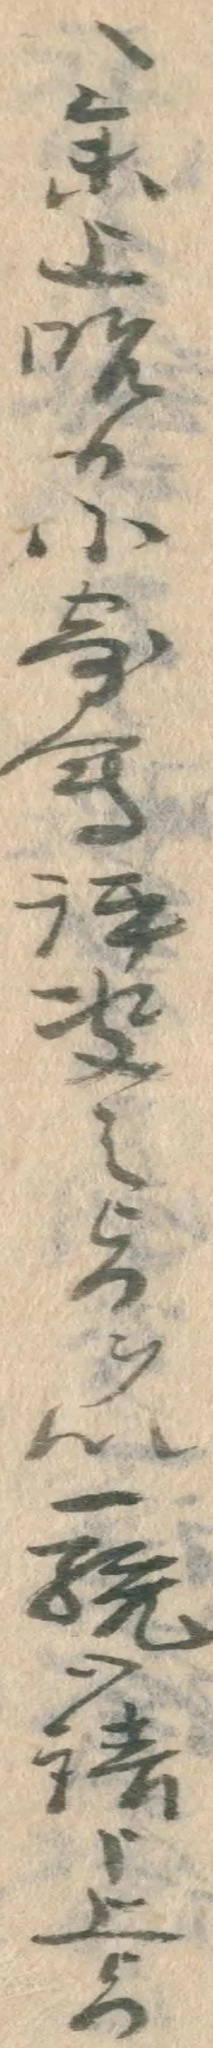へ参上、昨日小寄会評決之旨ヲ以、一統御請申上候旨
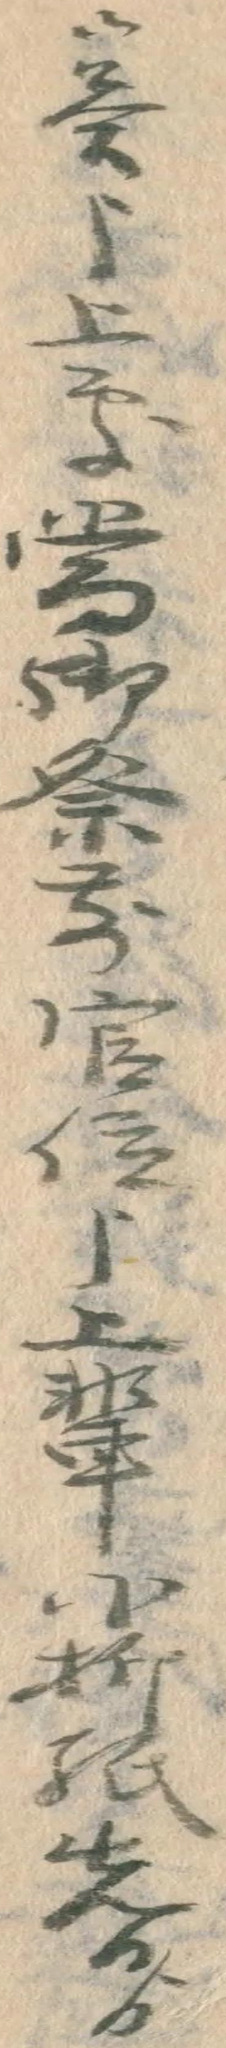御答申上候處、當御祭前官位申上輩、小折紙先日ゟ
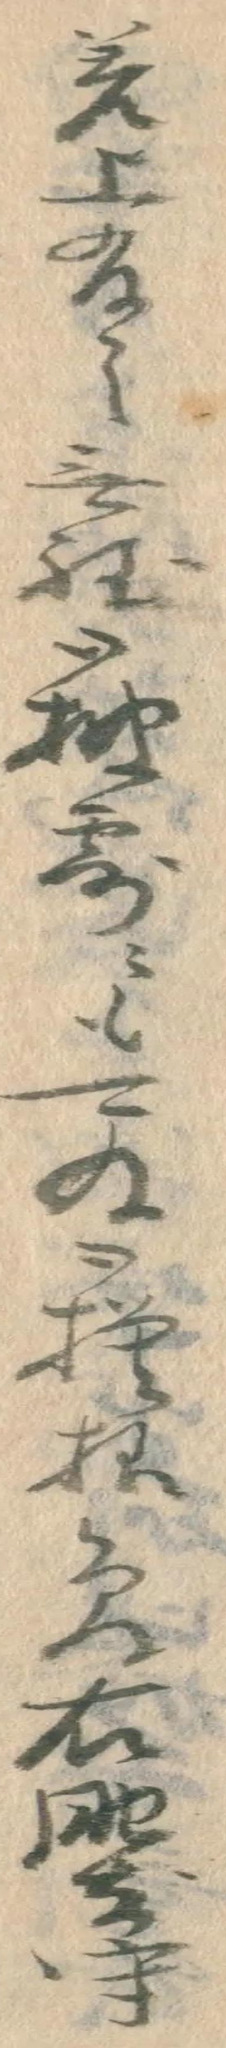差上有之、無程御披露ニも可及御模様ニ候、右肥前守
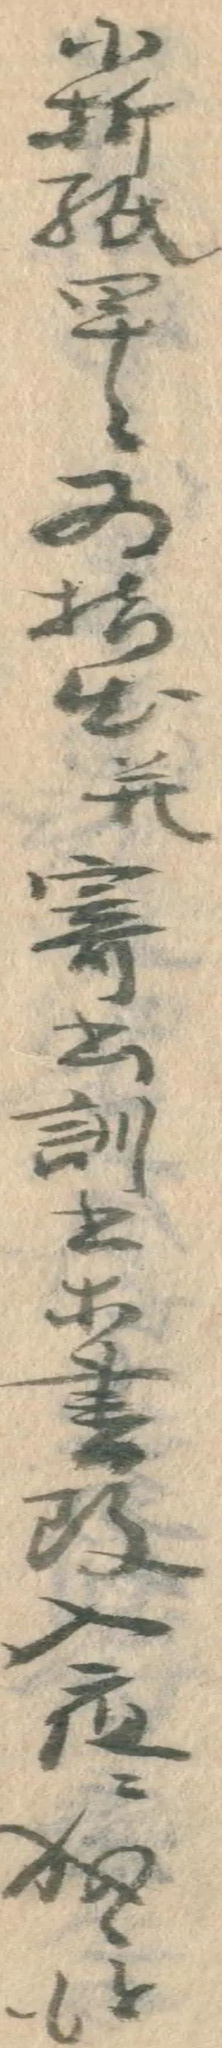小折紙早々為指出、并寄書・訓書等書改、入夜ニ成候
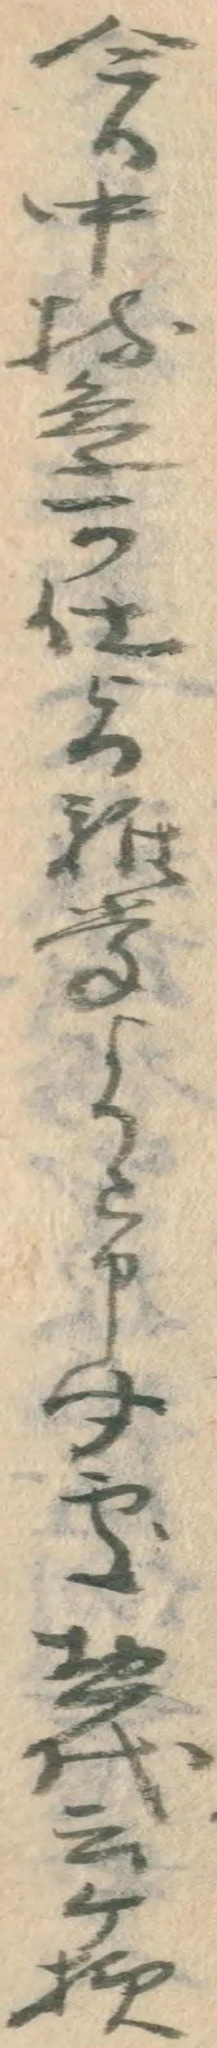今日中持参可仕旨、雑掌より被申聞處、惣代云ケ様

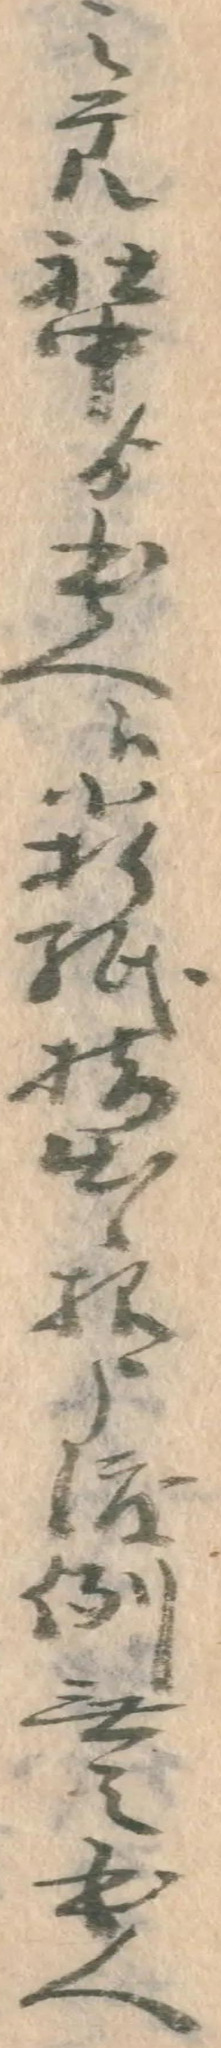ニテハ、社中ゟ本人え小折紙指出候様申渡例無之、本人
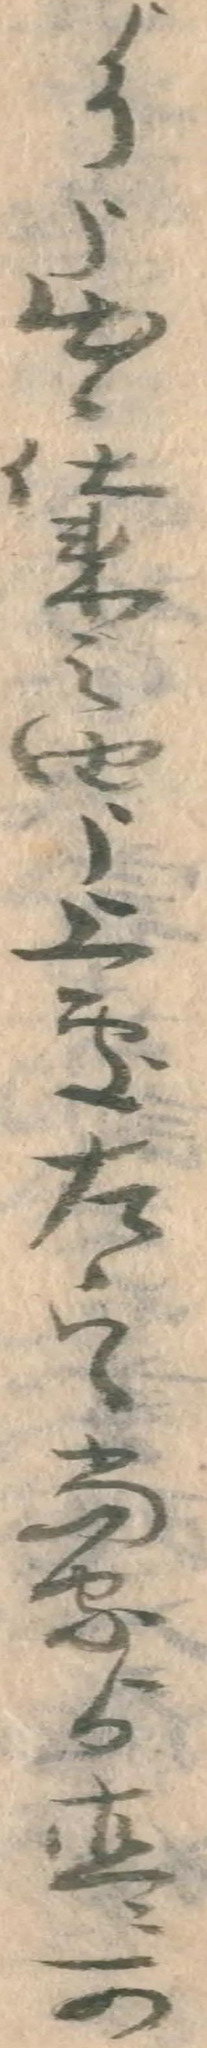より申出候仕来之由申上處、左候ハヽ、當家ゟ直ニ可
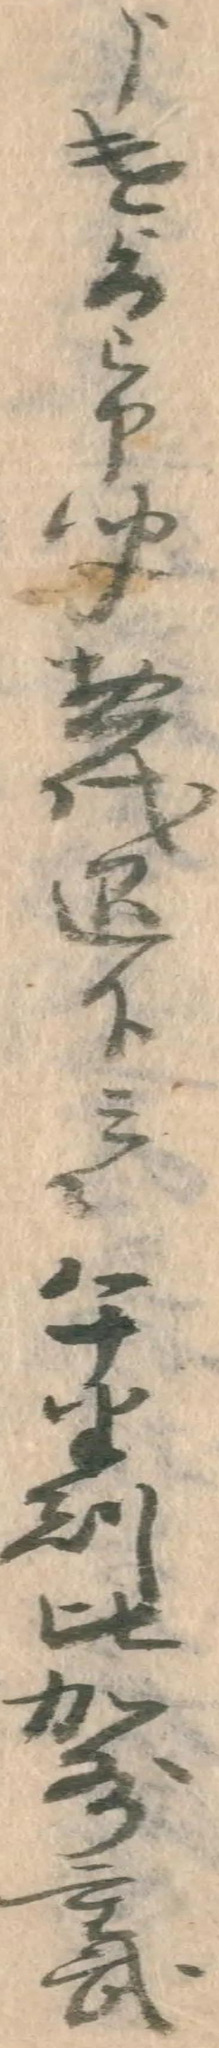申遣旨被申聞、惣代退下ニ而、午半刻比加州重武
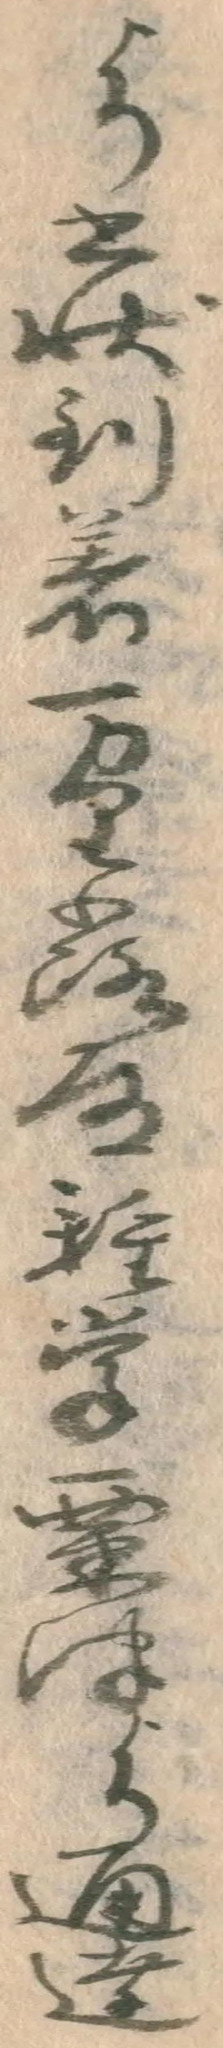より書状到着、万里小路殿雑掌粟津より通達
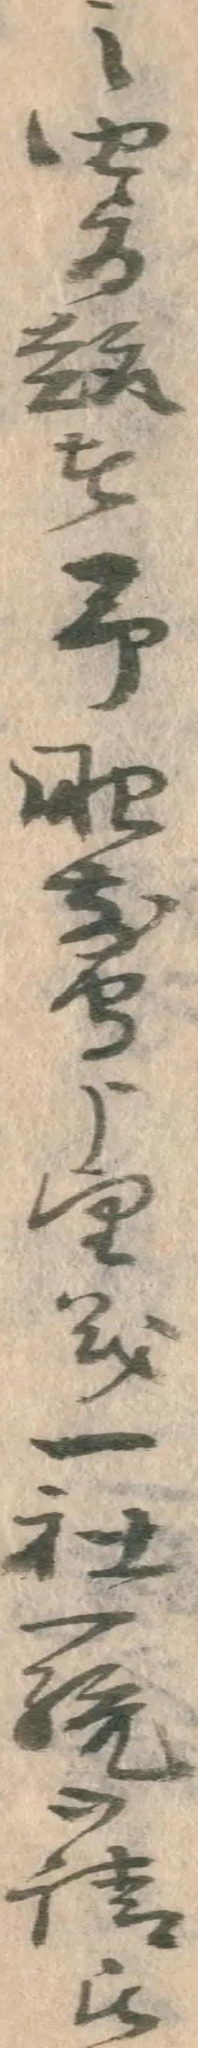之由、旨趣者、予肥前守申由義、一社一統御請被
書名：賀茂社記録. 第63冊
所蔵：国立国会図書館 National Diet Library, JAPAN
